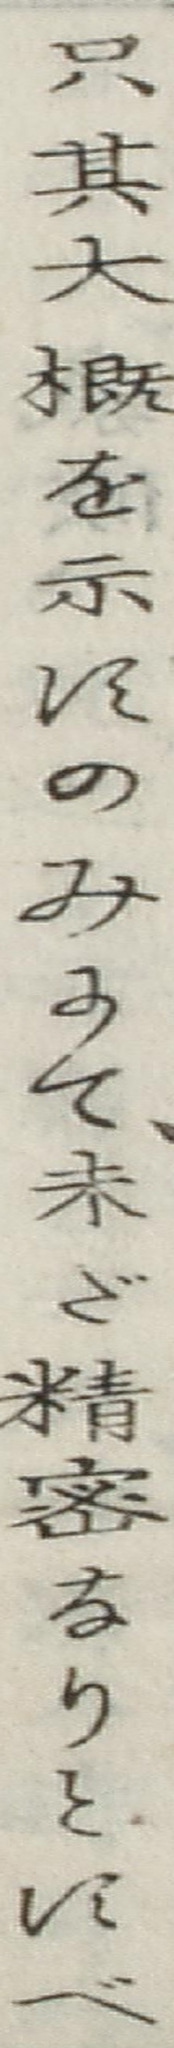只其大概を示すのみにて、未だ精密なりとすべ
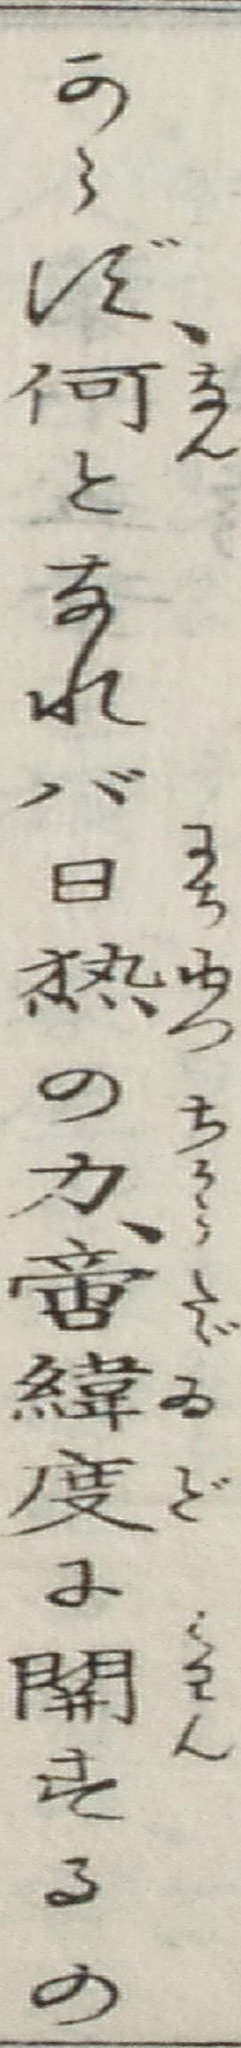からず、何となれば日熱の力、啻緯度に開するの
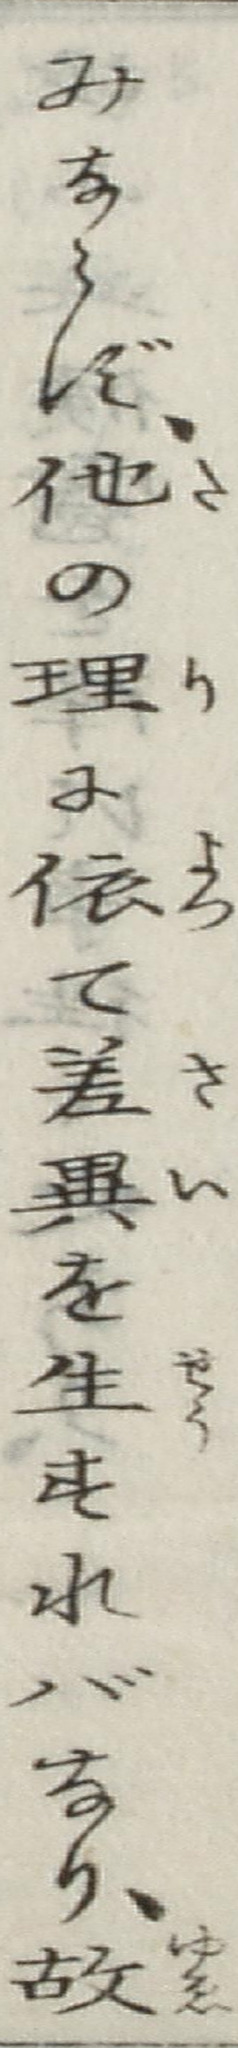みならず、他の理に依て差異を生すればなり、故
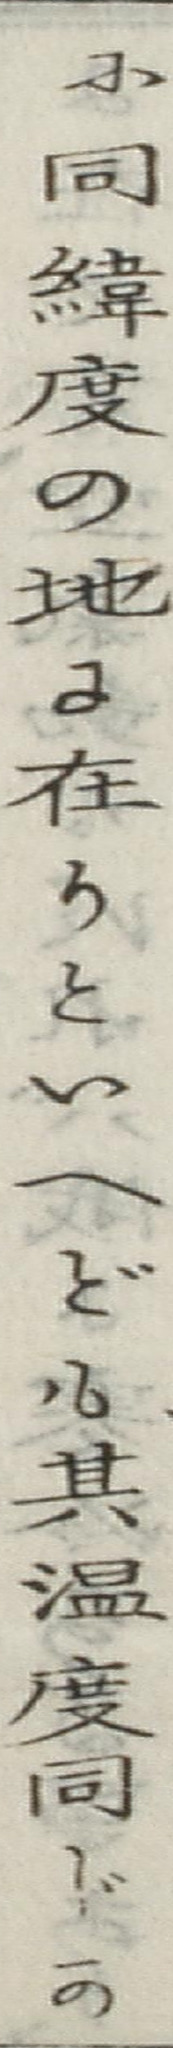に同緯度の地に在りといへども、其温度同じか
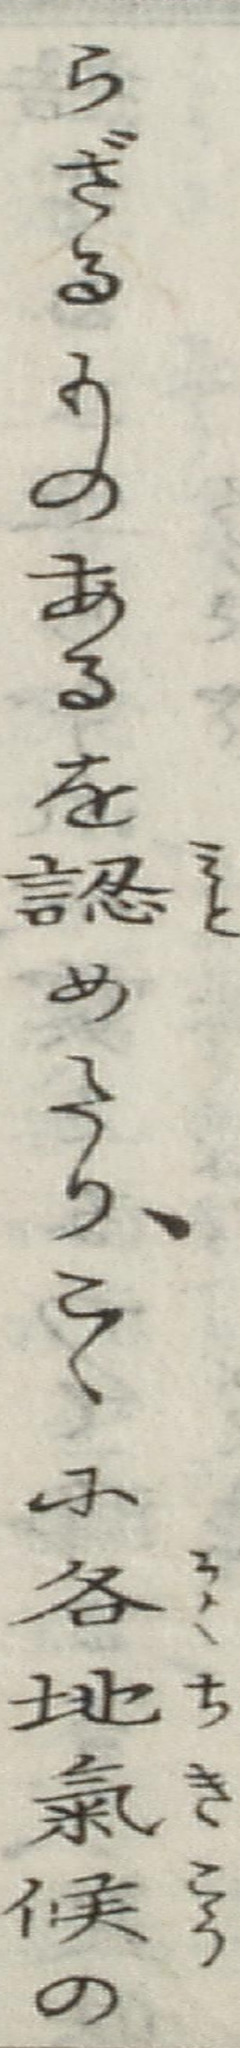らざるものあるを認めたり、こゝに各地気候の
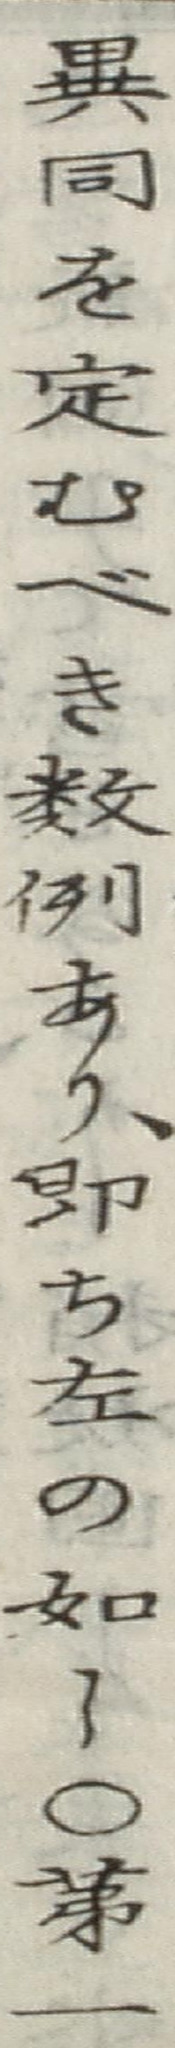異同を定むべき数例あり、即ち左の如し○第一
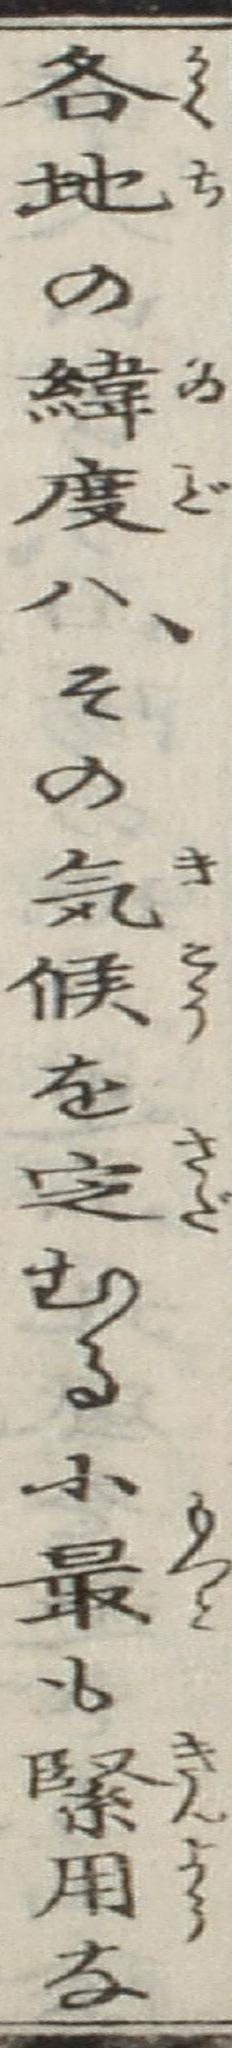各地の緯度は、その気候を定むるに最も緊用な
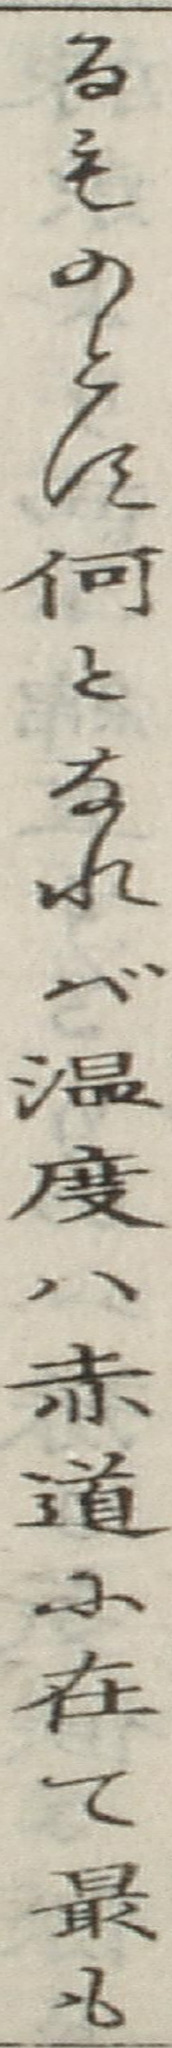るものとす、何となれば温度は赤道に在て最も
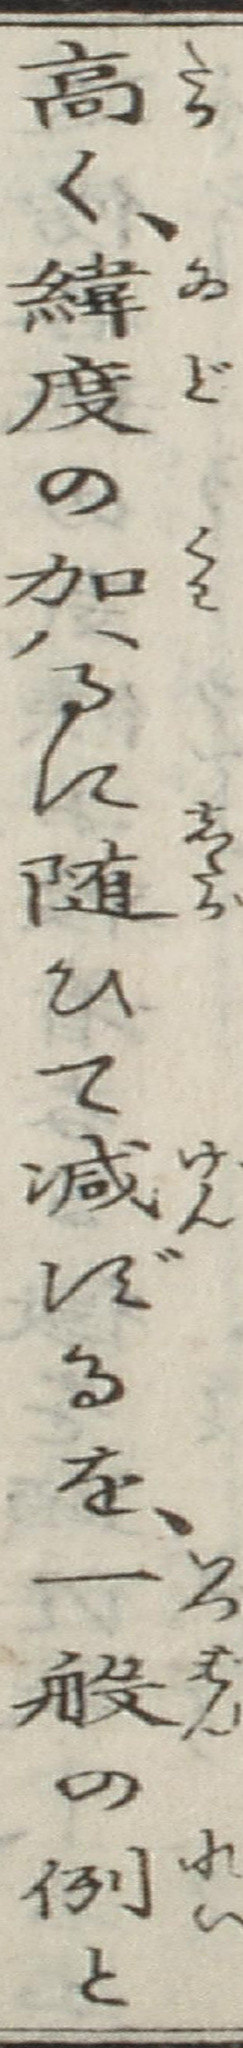高く、緯度の加はるに随ひて減ずるを、一般の例と
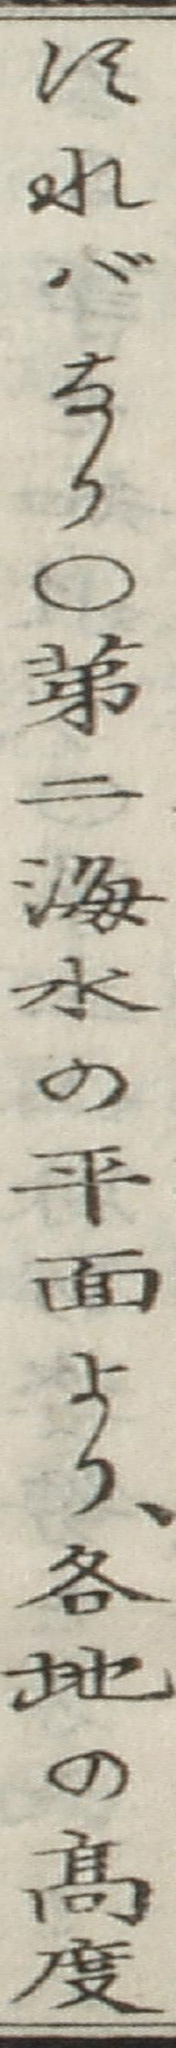すればなり○第二、海水の平面より、各地の高度
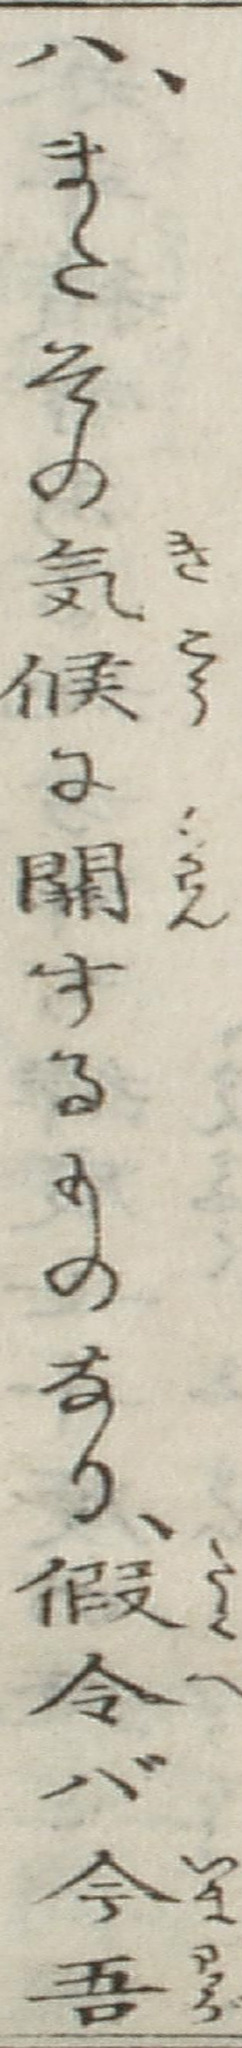は、またその気候に開するものなり、仮令ば今吾
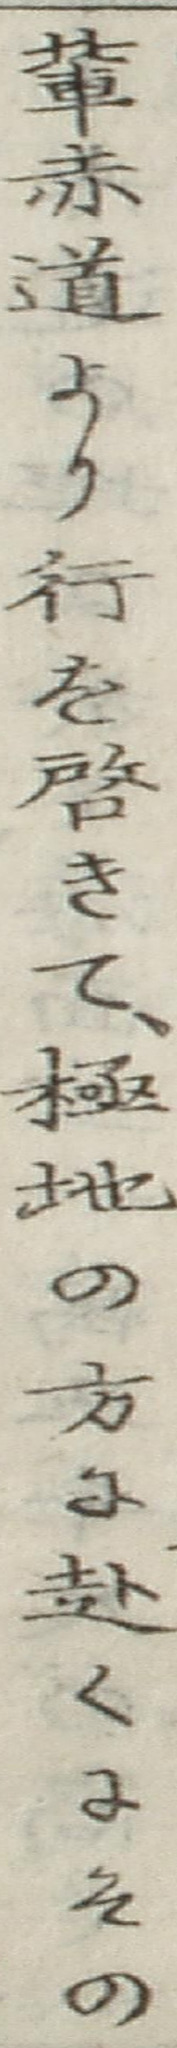輩赤道より行を啓きて、極地の方に赴くにその
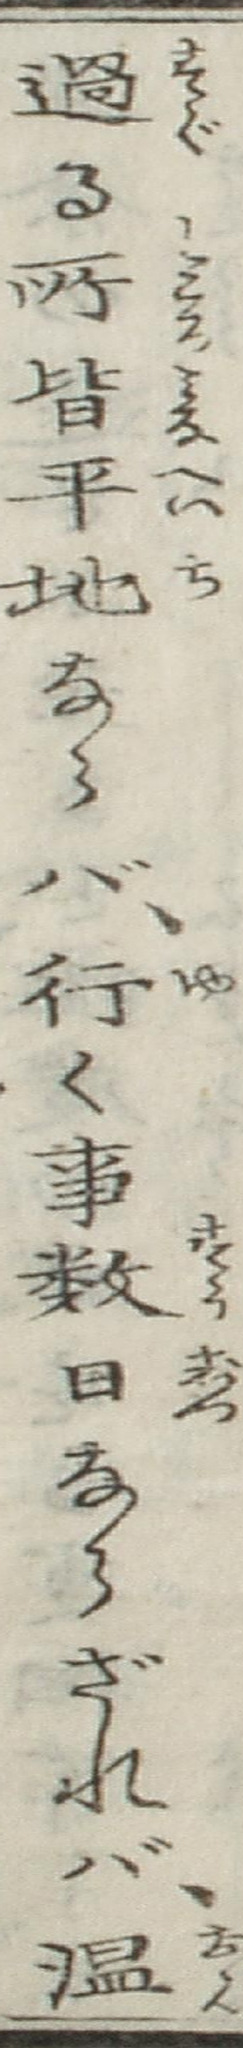過る所皆平地ならば、行く事数日ならざれば、温
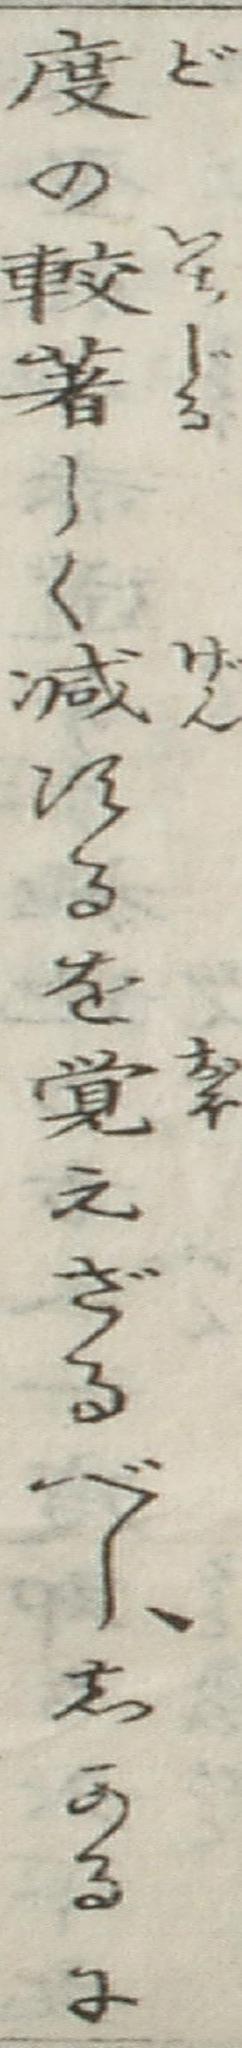度の較著しく減するを覚えざるべし、しかるに
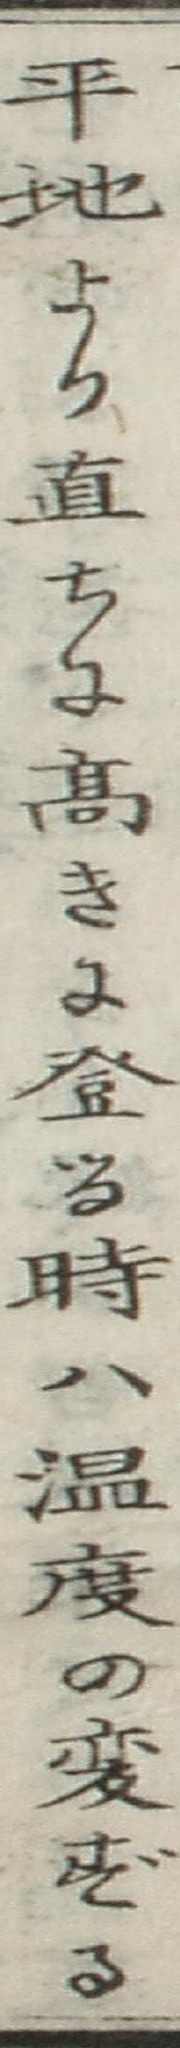平地より直ちに高きに登る時は、温度の変ずる

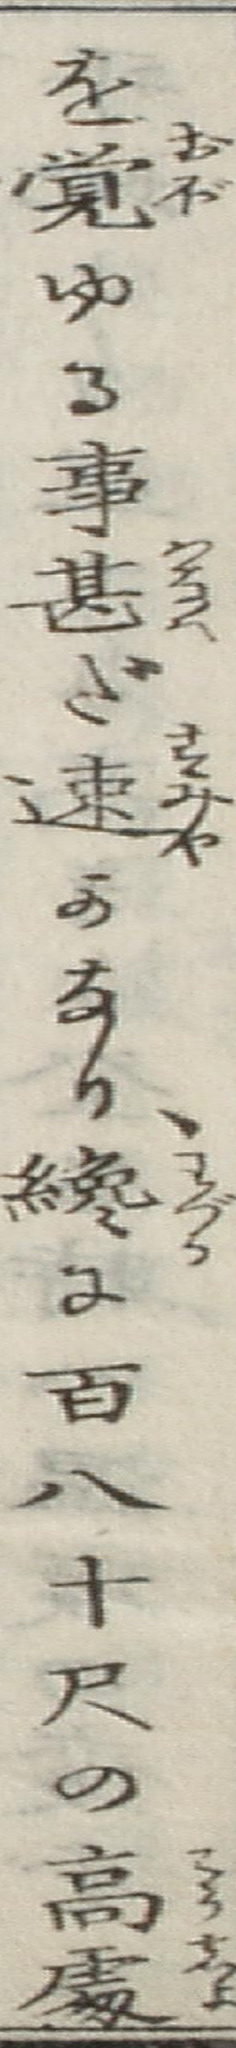を覚ゆる事甚だ速かなり、纔に百八十尺の高処
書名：訓蒙　天然地理學　下
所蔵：東京大学地震研究所図書室 Earthquake Research Institute Library, The University of Tokyo, JAPAN
